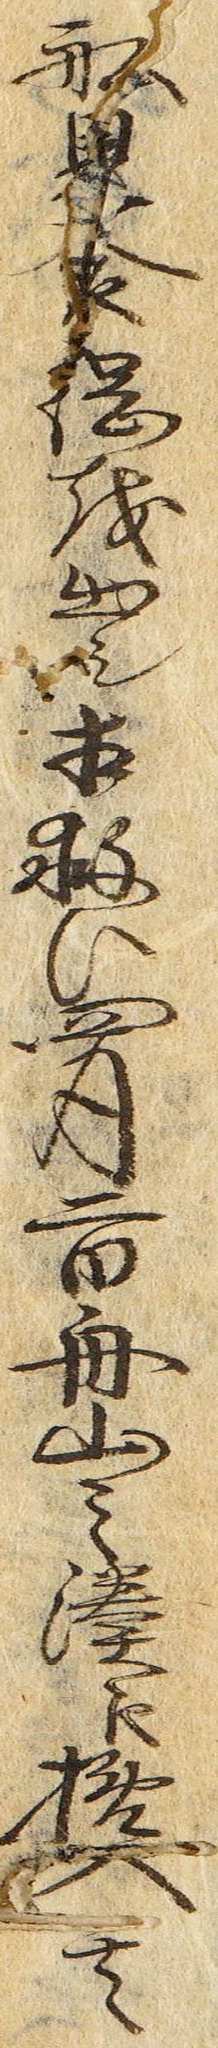船具綱を出シ相救ひ四月二日舟山之湊江挽入は
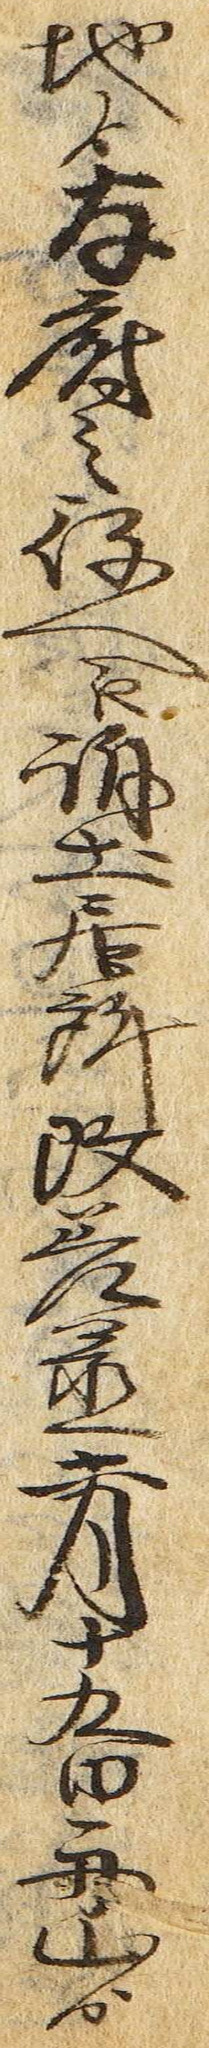地ゟ官府之役人江訴出居所改差置六月十九日舟山ゟ
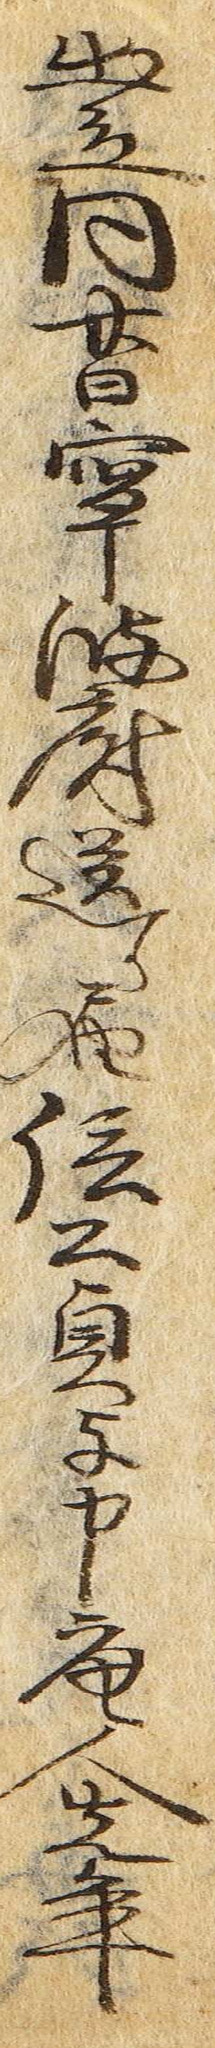出立同廿日寧波府送り届信公貞与申唐人先年
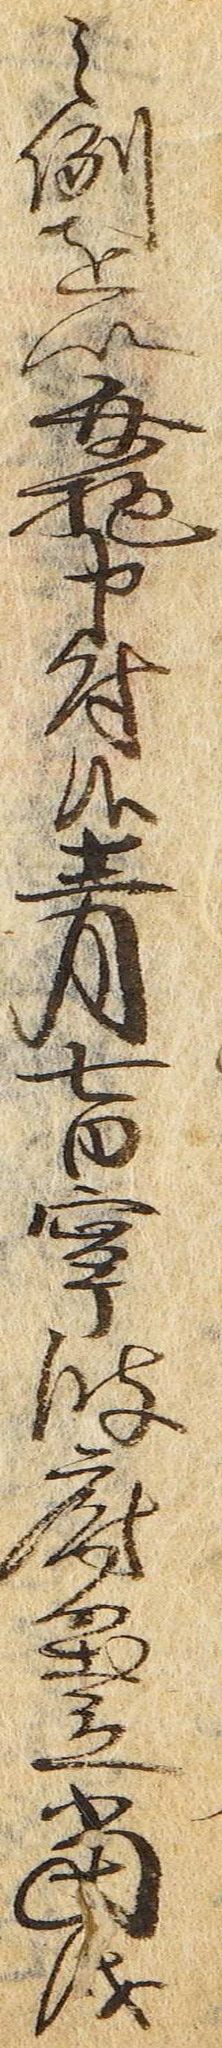之例を以介抱申付候十二月七日寧波府へ出立当儀
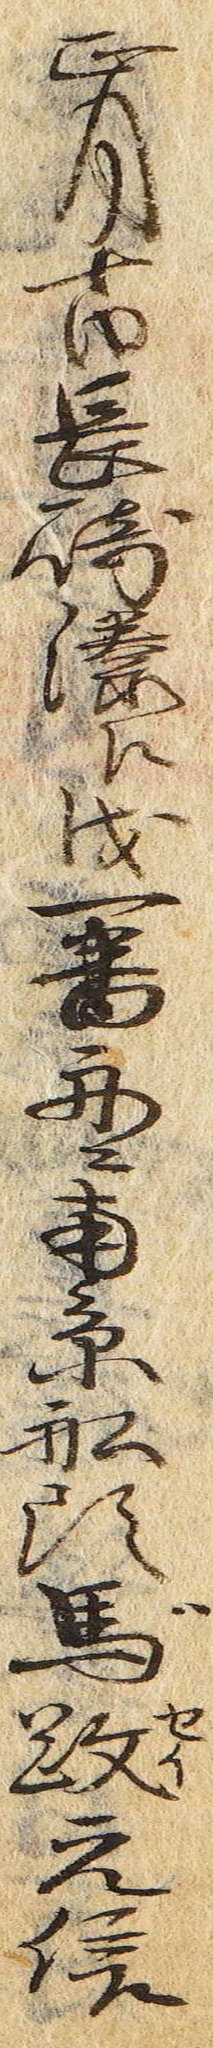正月十日長崎湊江戌一番舟ニ南京船頭馬政元信
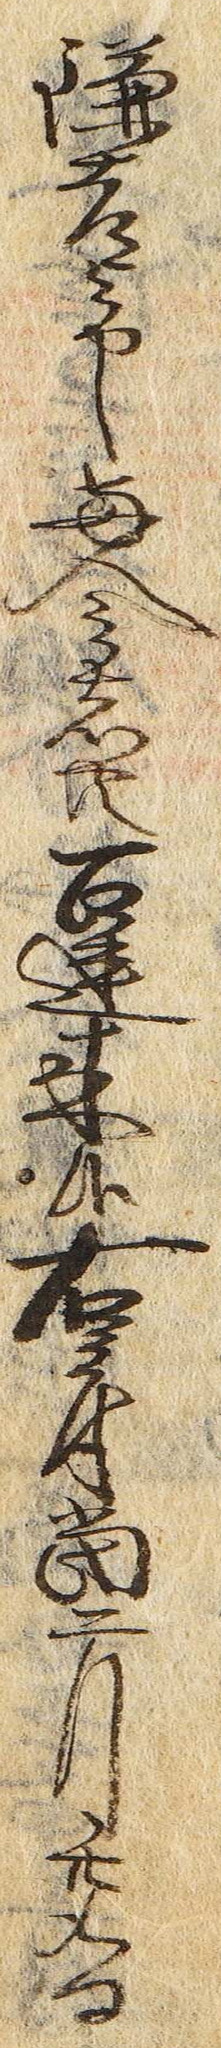鎌吉与申両人之者共召連来候右ニ付当二月廿九日
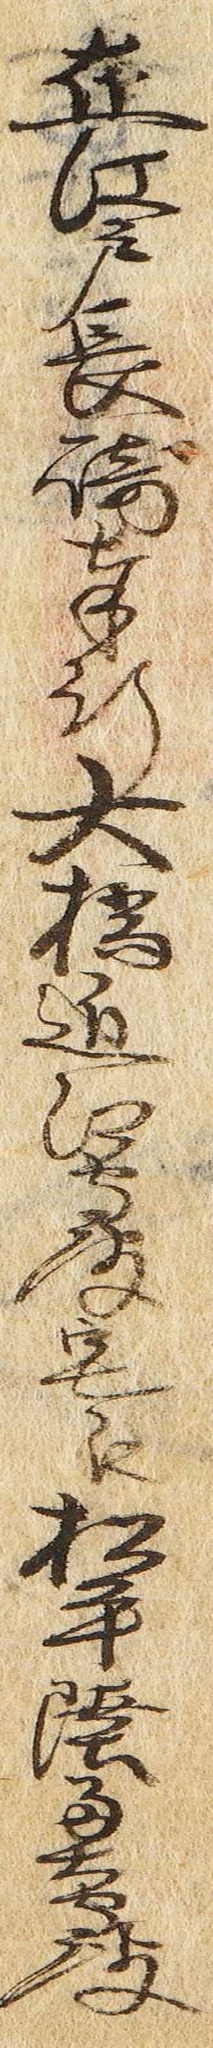在江戸長崎奉行大橋近江守殿宅江松平陸奥守殿
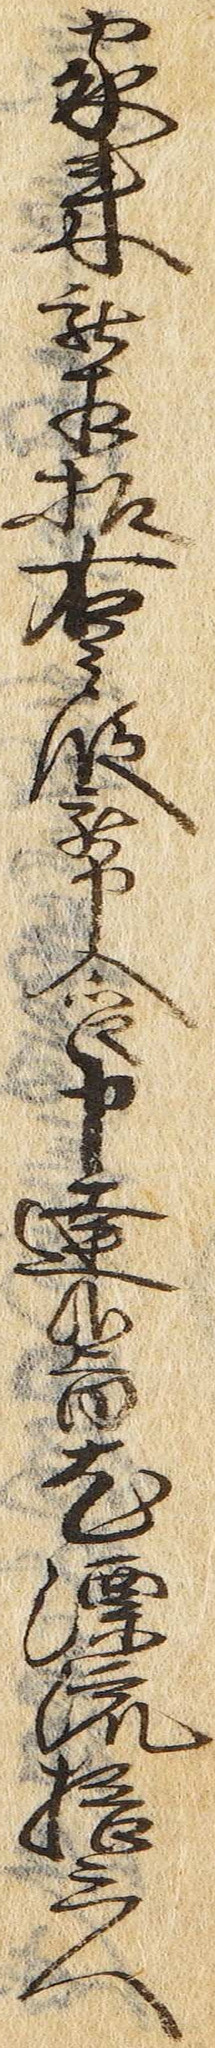家来被相招右之段被申含申達候旨尤漂流拾三人
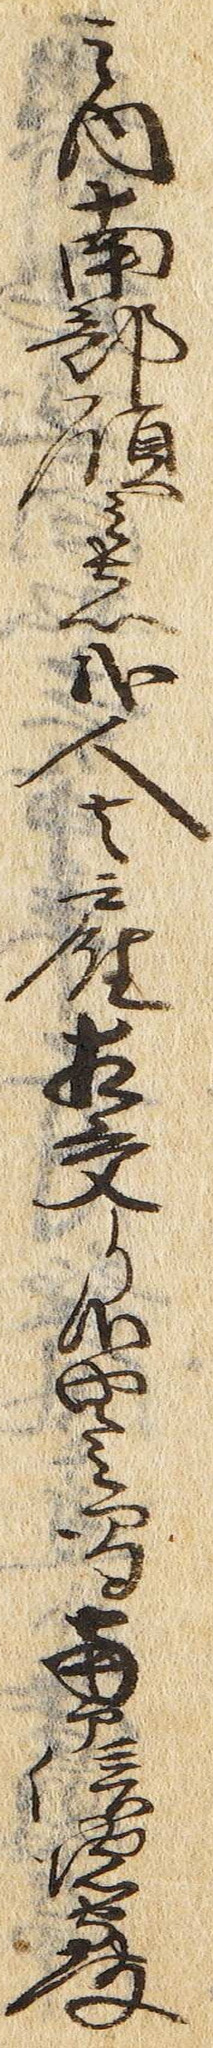之内南部領之者弐人は雇相交り候由之間南部信濃守殿
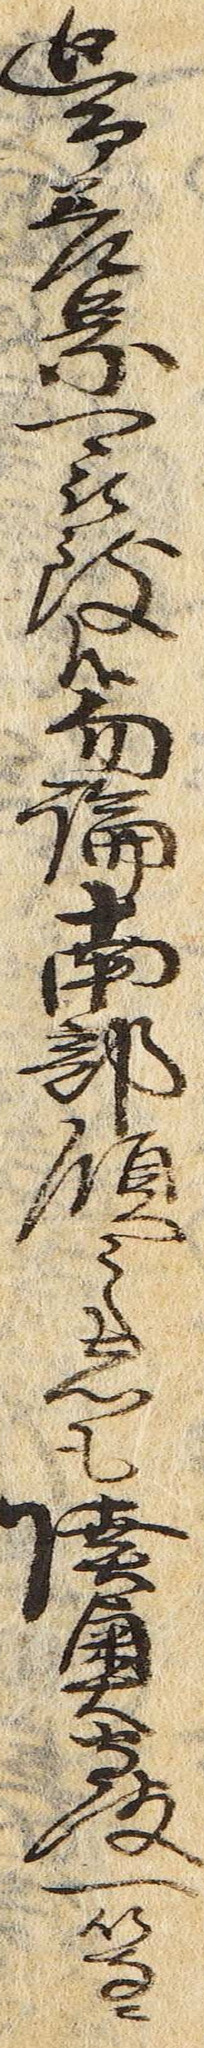追而差図可被致候勿論南部領之者も陸奥守殿一等ニ
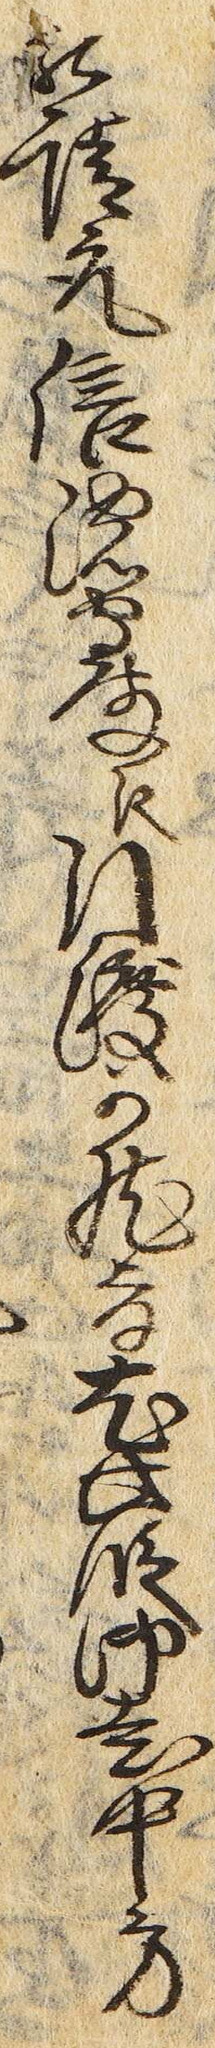被請取信濃守殿江引渡可然旨尤此段御老中方
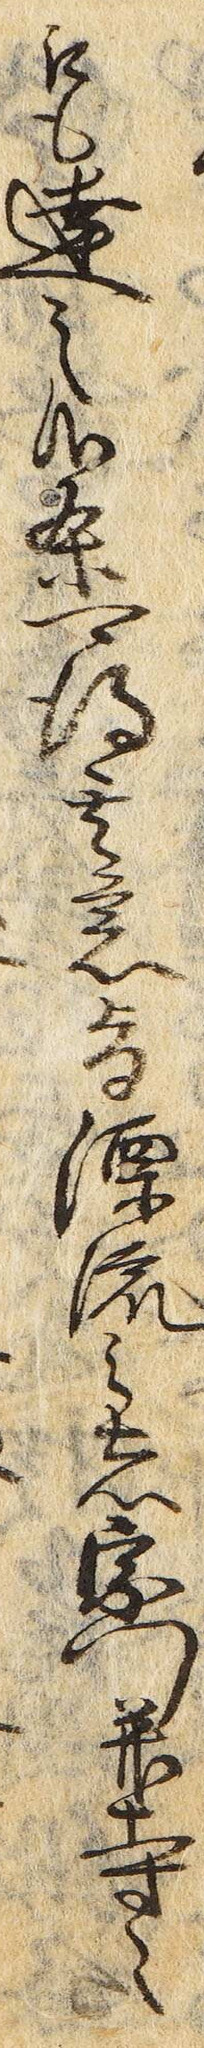江も達之候条可得其意旨漂流之者宗門幷寺々
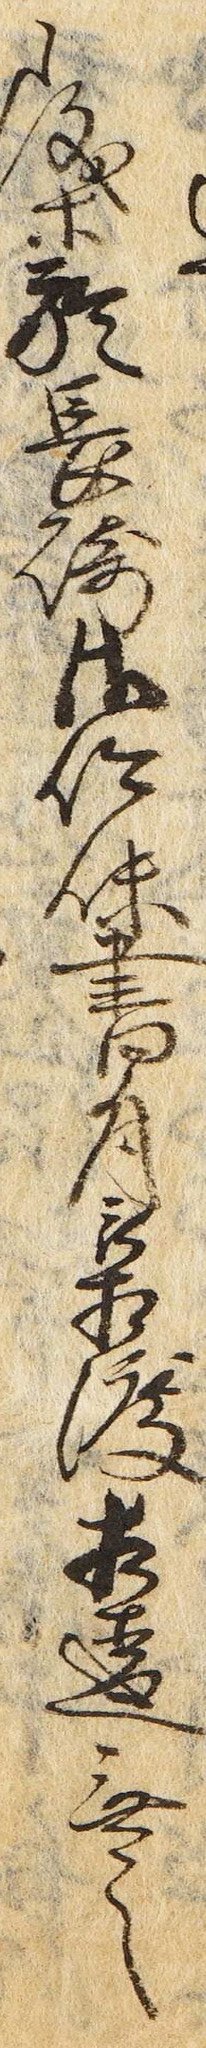之儀等於長崎御吟味書付被相渡相違無之
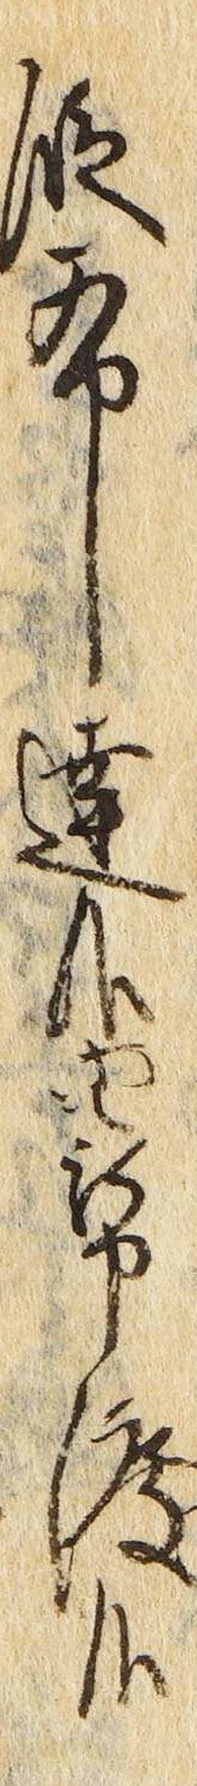段可申達候由被申渡候
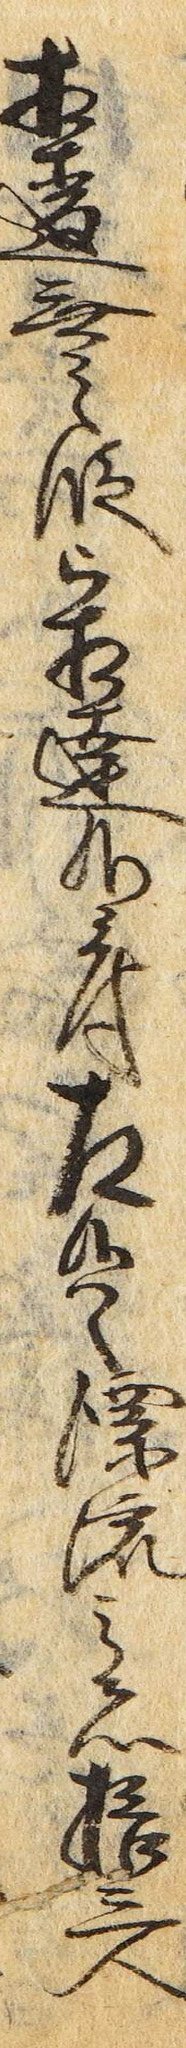相違無之段相達候ニ付左候ハヽ漂流之者拾三人
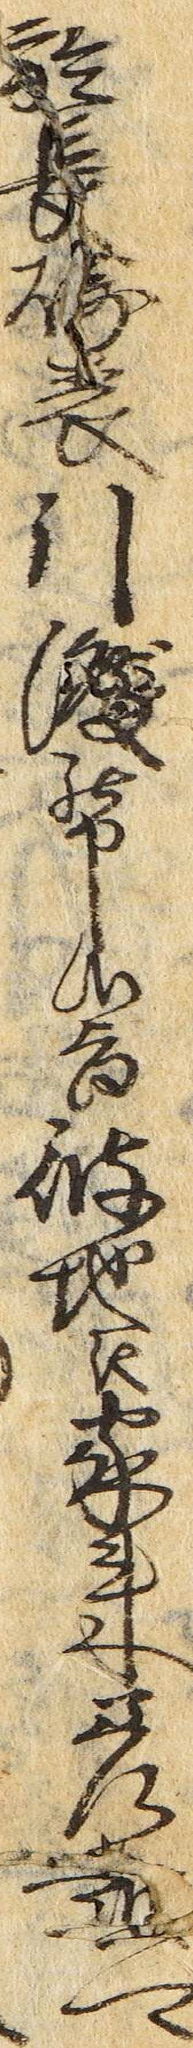於長崎表引渡被申候旨彼地江家来差越可
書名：奥州仙台領之者唐国江漂流一件
